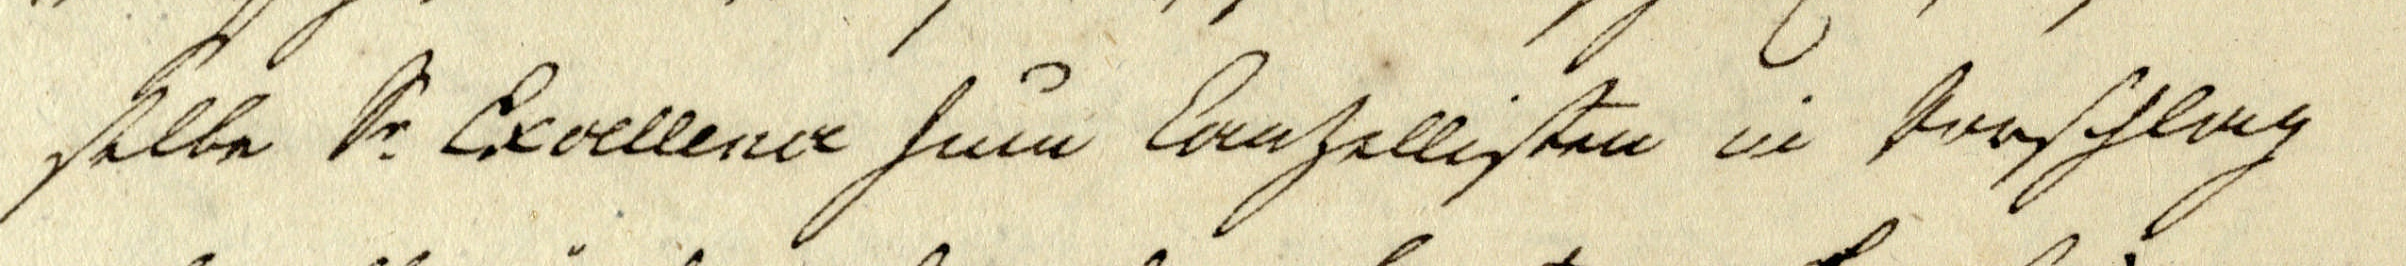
selbe Sr Excellence zum Canzellisten in Verschlag
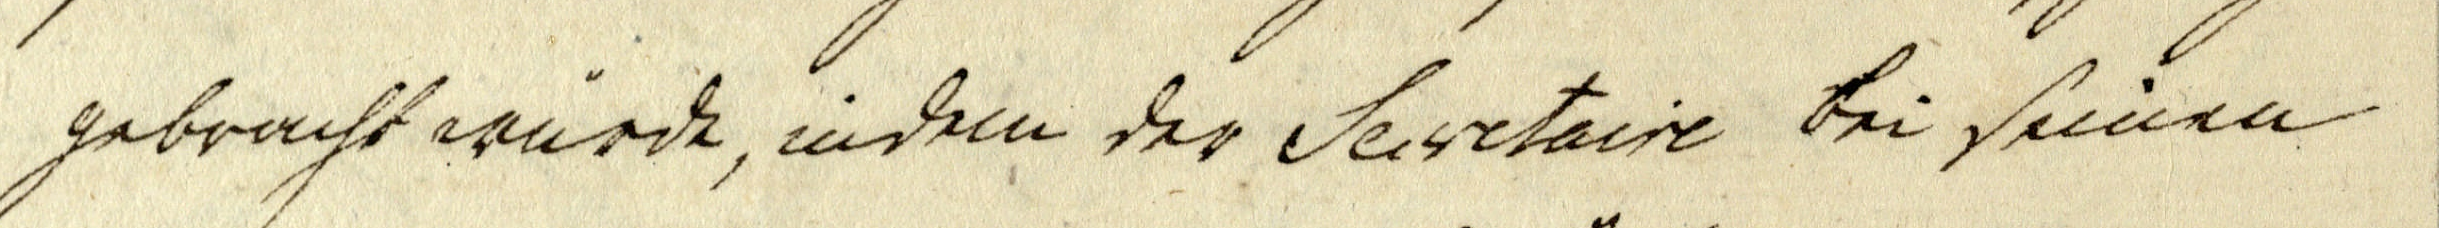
gebracht würde, indem der Secretaire bei seinen
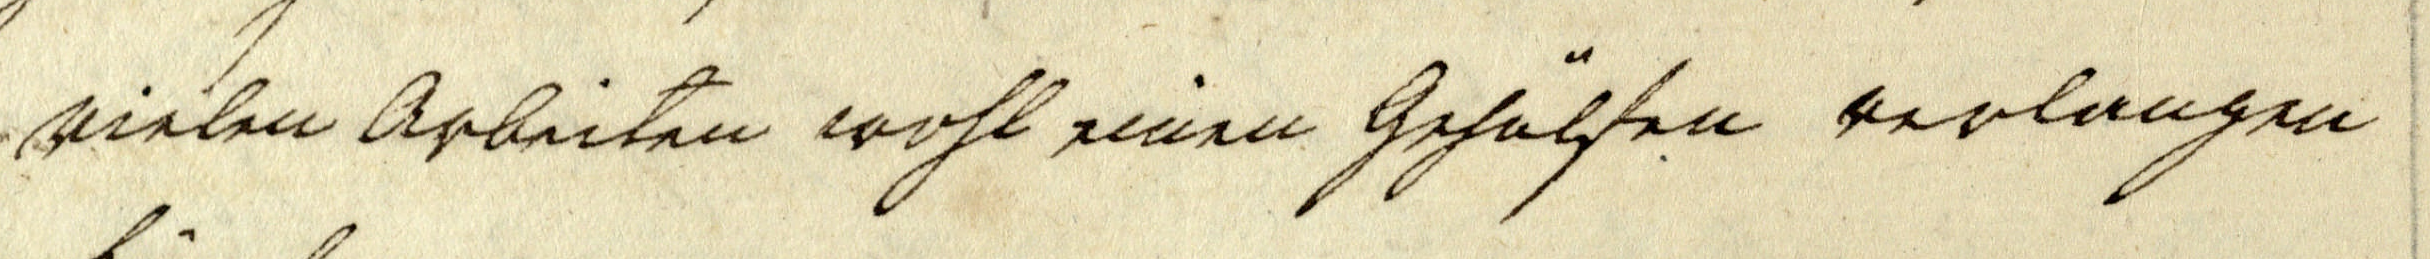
vielen Arbeiten wohl einen Gehülfen verlangen
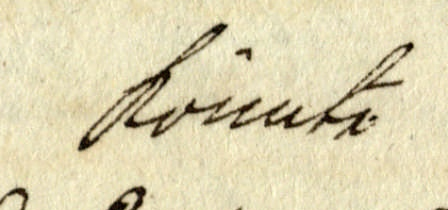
könnte.
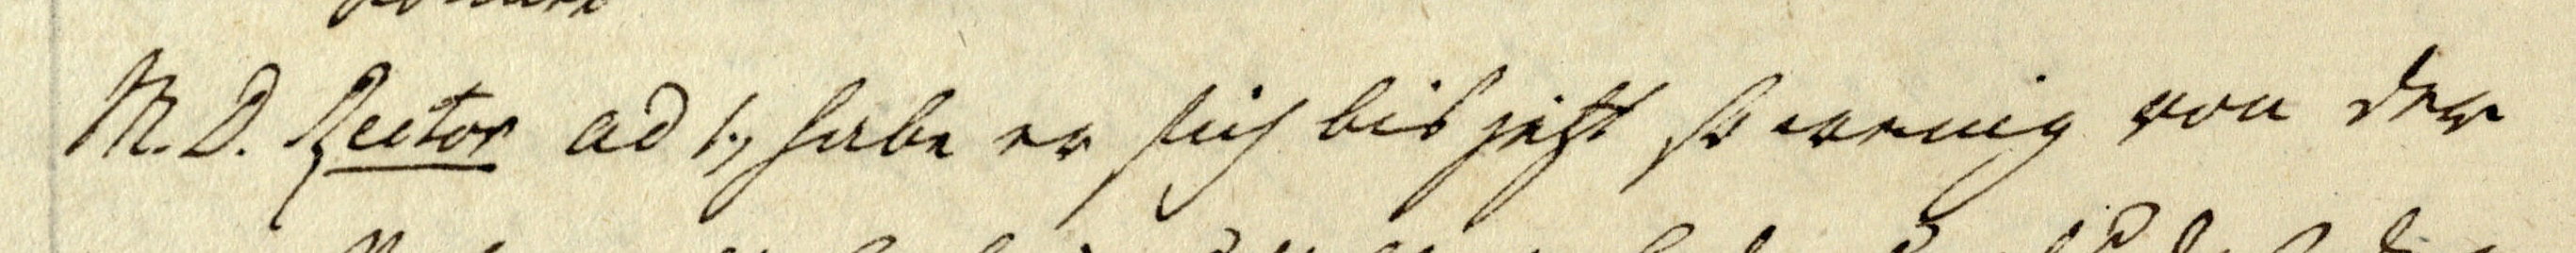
M. D. Rector. ad 1., habe er sich bis jetzt so wenig von der
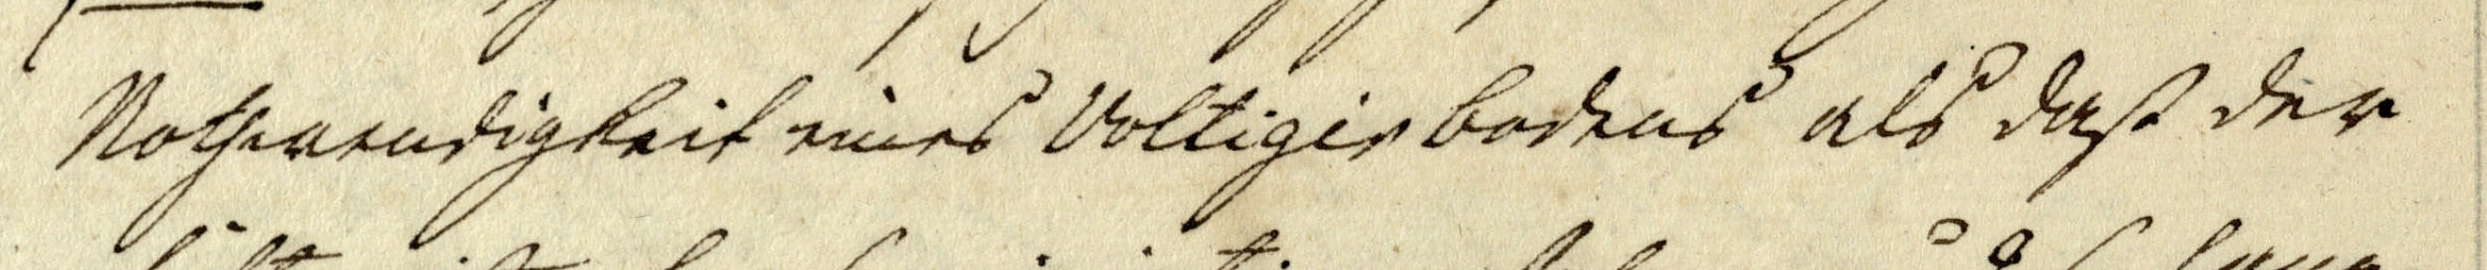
Nothwendigkeit eines Voltigirbodens als daß der
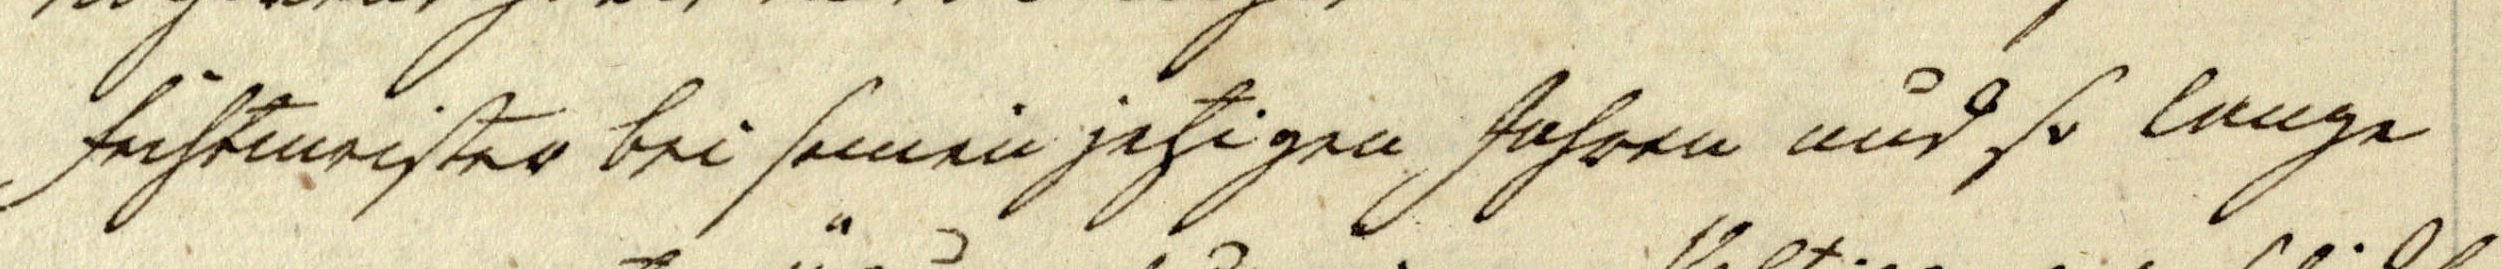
Fechtmeister bei seinen jetzigen Jahren und so lange
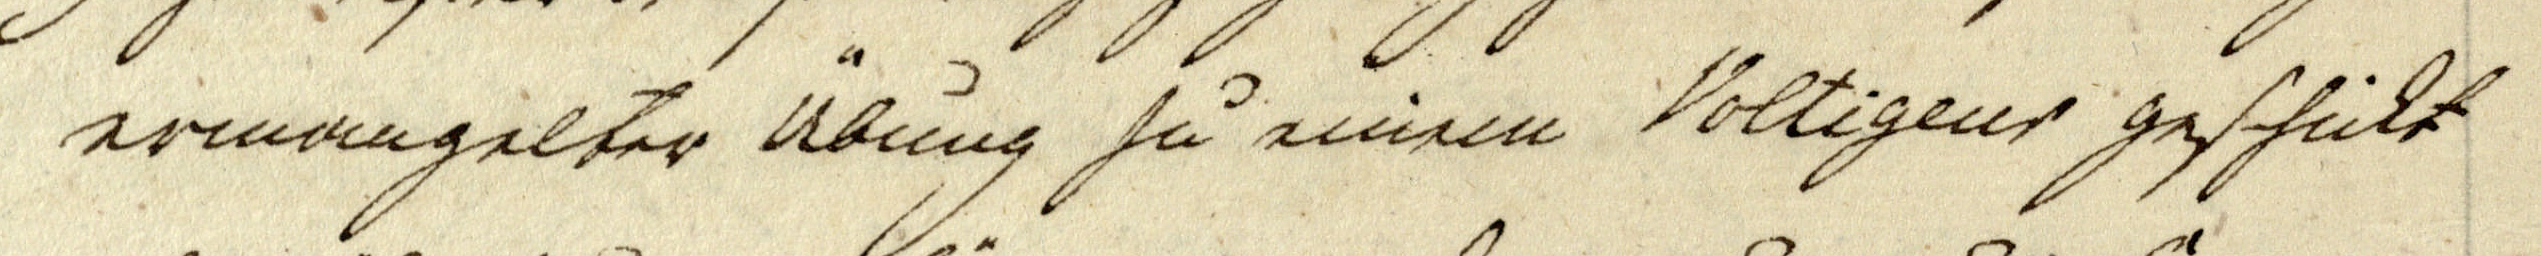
ermangelter Übung zu einem Voltigeur geschickt
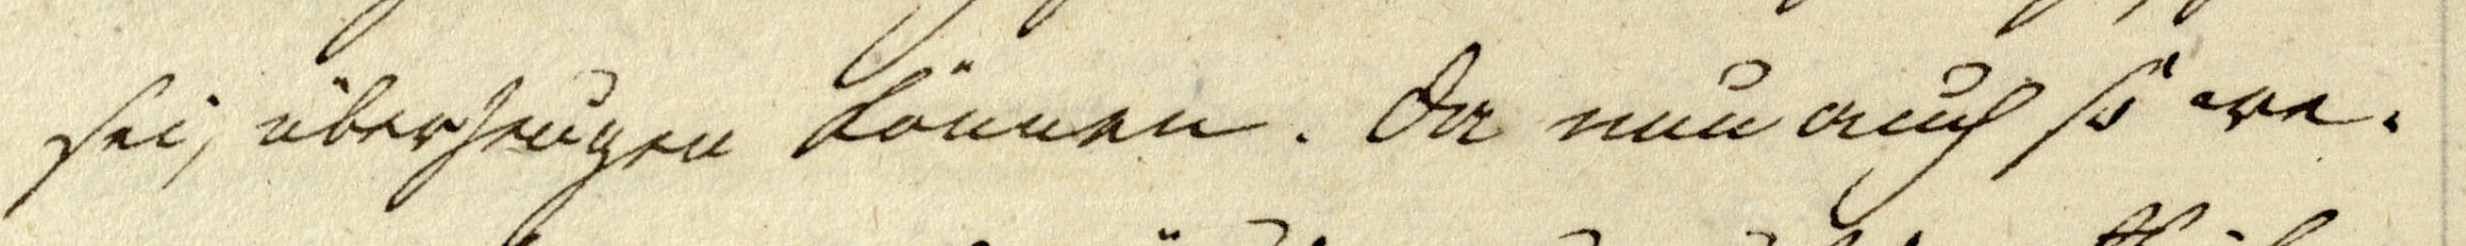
sei, überzeugen können. Da nun auch so we¬
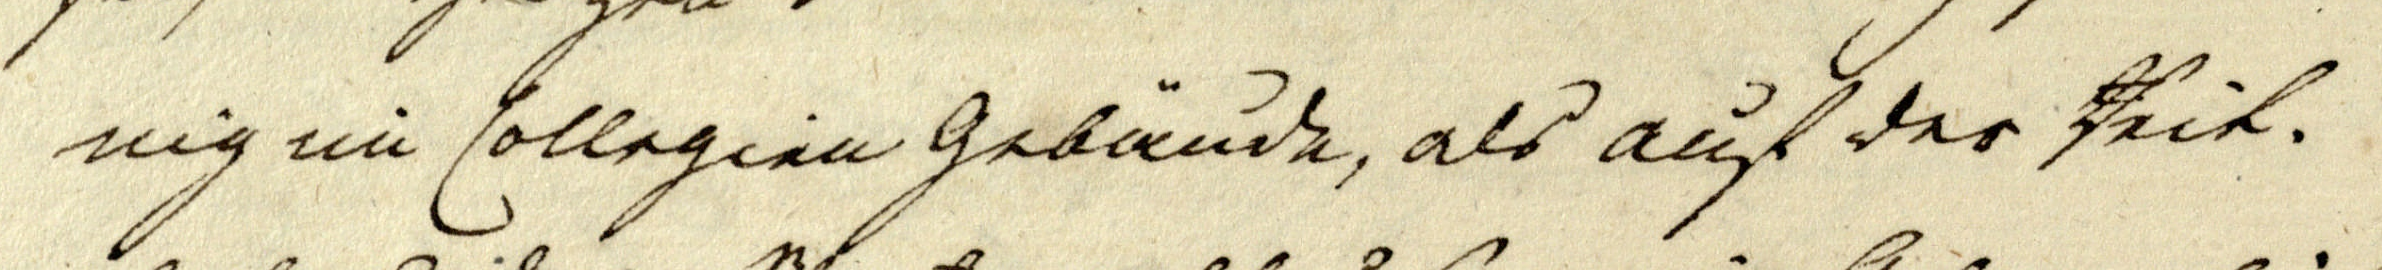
nig in Collegien Gebäude, als auf der Reit¬
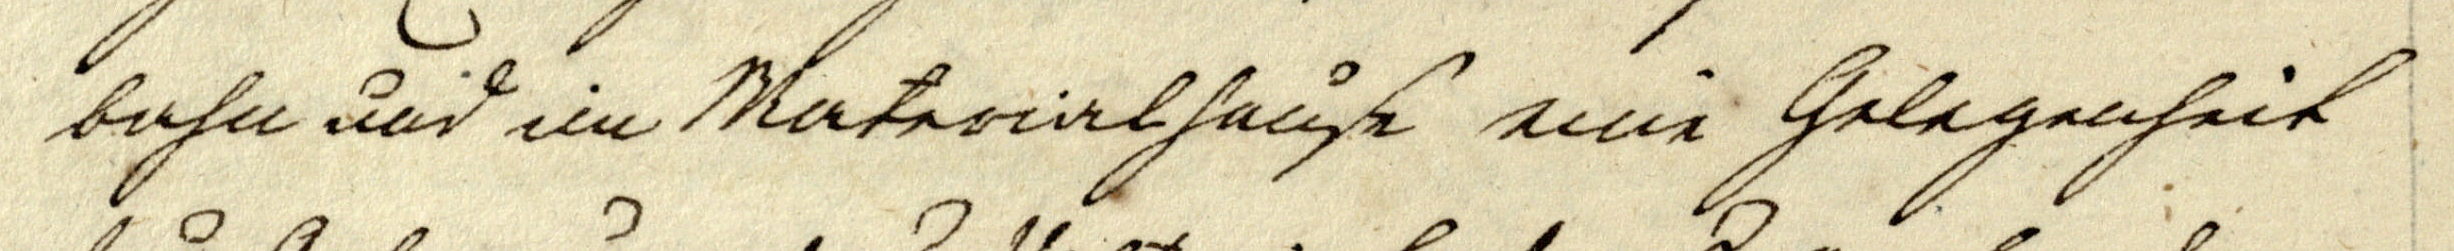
bahn und im Materialhause eine Gelegenheit
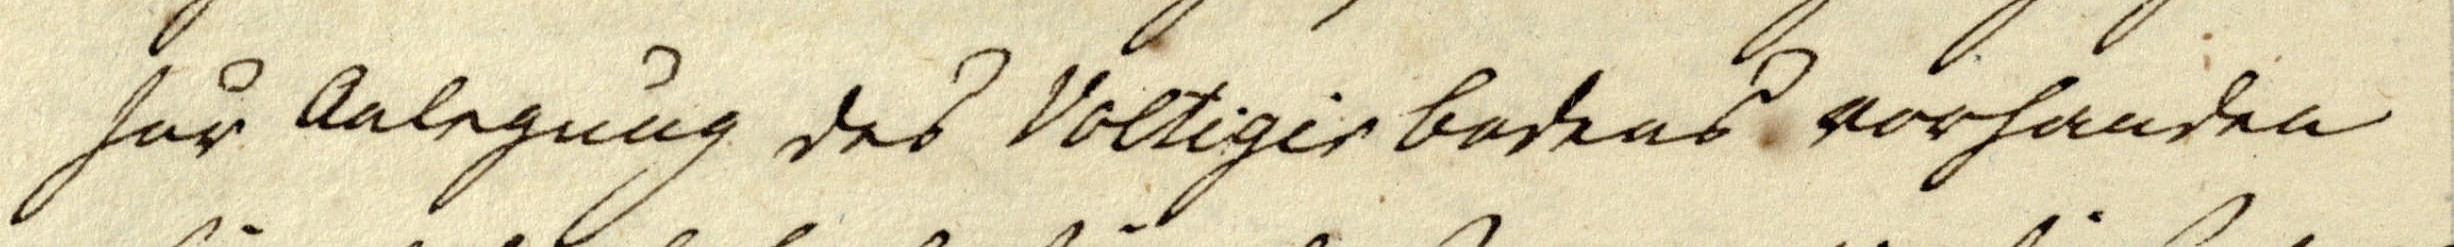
zur Anlegung des Voltigirbodens vorhanden
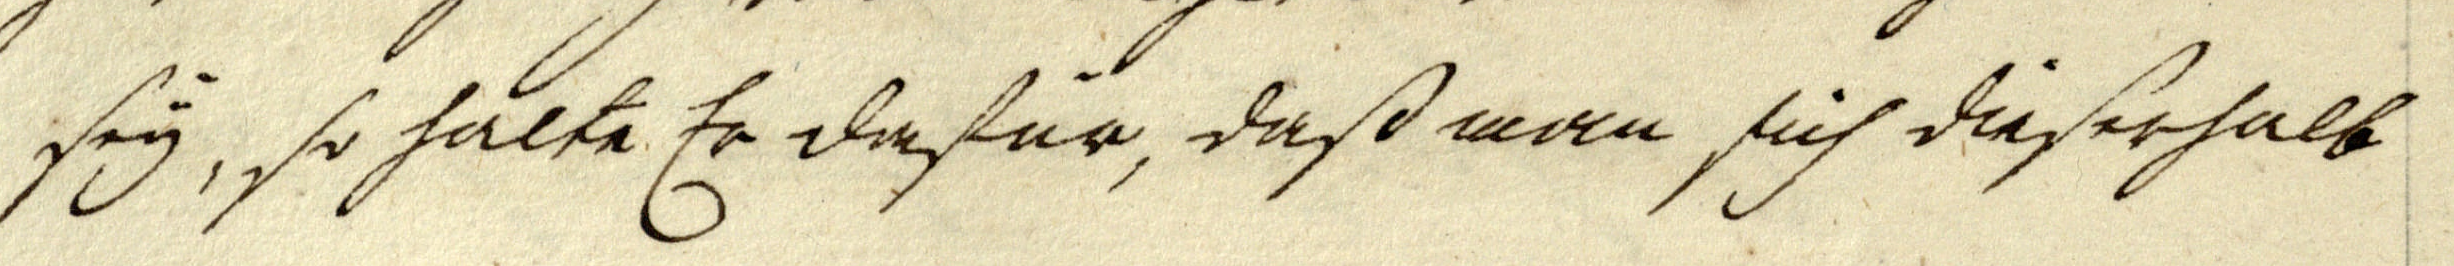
seÿ, so halte Er dafür, daß man sich dieserhalb
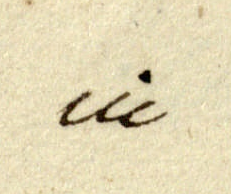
in
